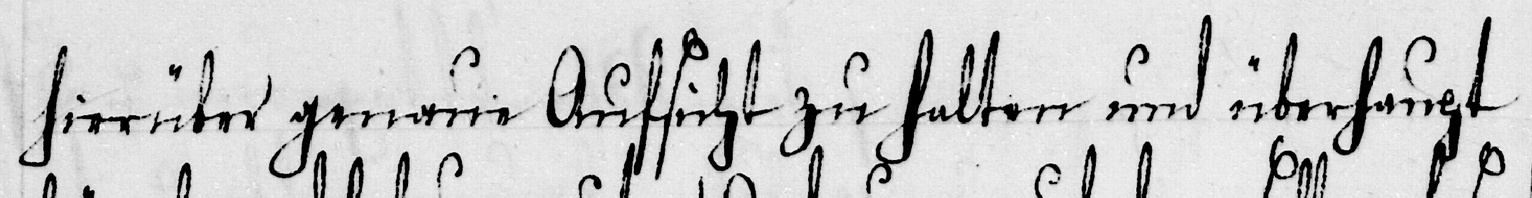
hierüber genaue Aufsicht zu halten und überhaupt
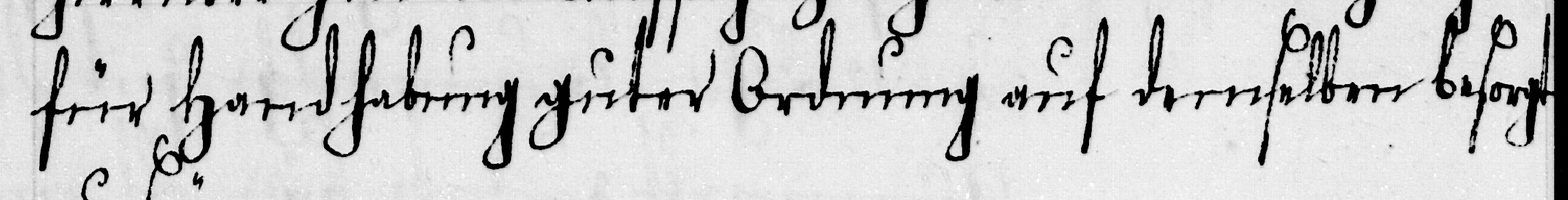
für Handhabung guter Ordnung auf demselben besor¬
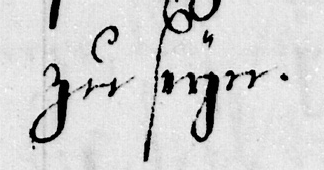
zu seyn.
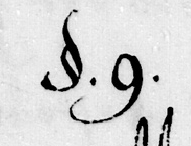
§. 9.
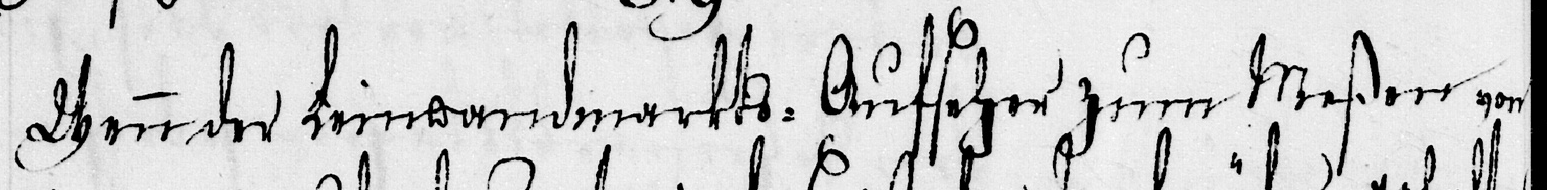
Wenn der Leinwandmarkt-Aufseher zum Meßen von
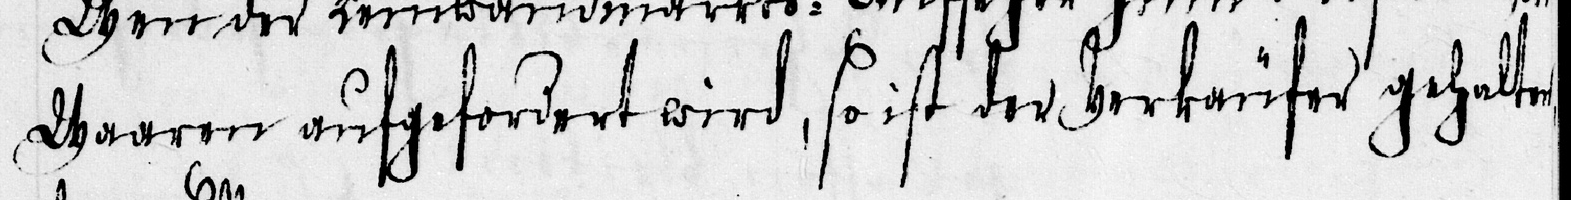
Waaren aufgefordert wird, so ist der Verkäufer gehalten,
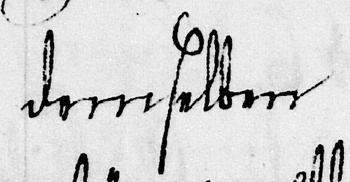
demselben
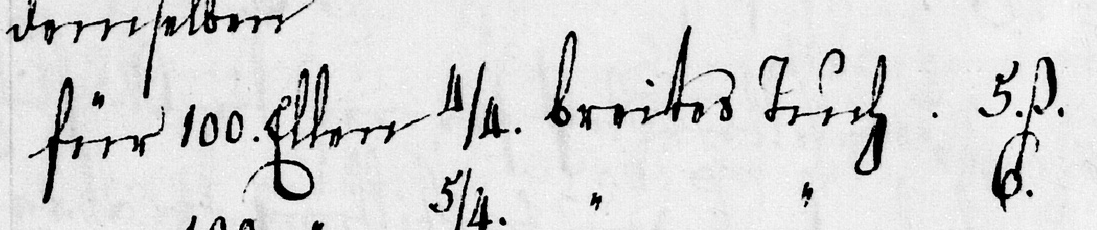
für 100. Ellen 4/4. breites Tuch 5.
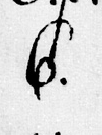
7.
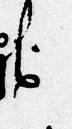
2.
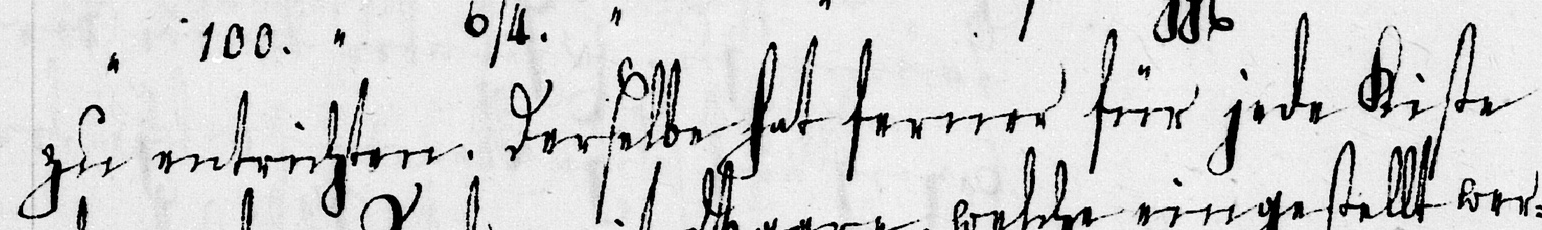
zu entrichten. Derselbe hat ferner für jede Kiste
